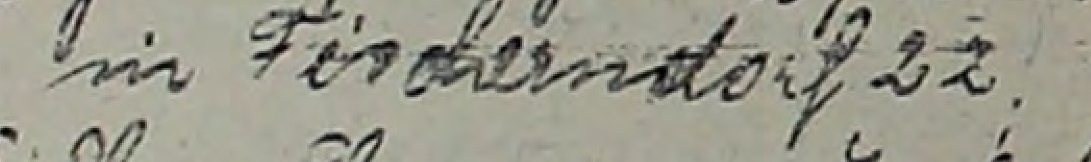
in Fischerndorf 22;
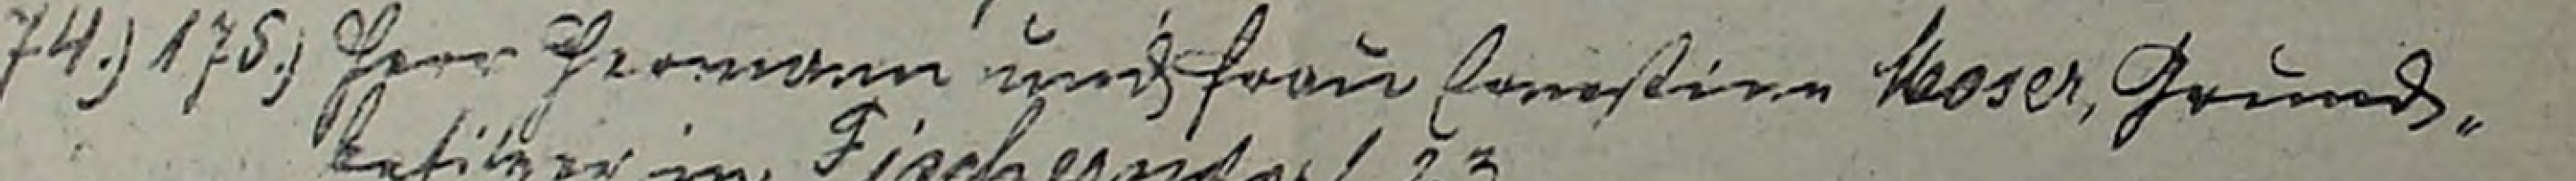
174.) 175.) Herr Hermann und Frau Ernestine Moser, Grund„
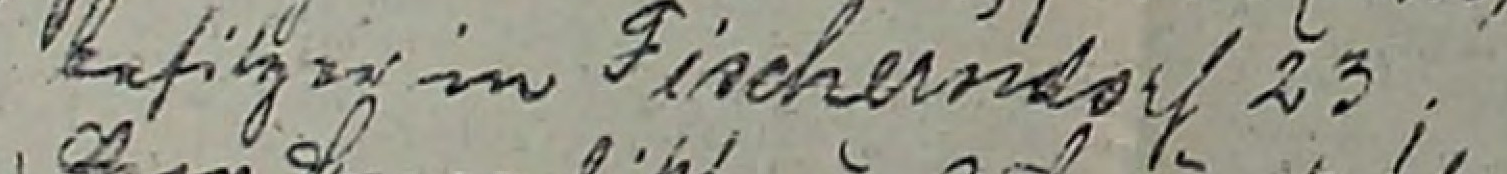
besitzer in Fischerndorf 23;
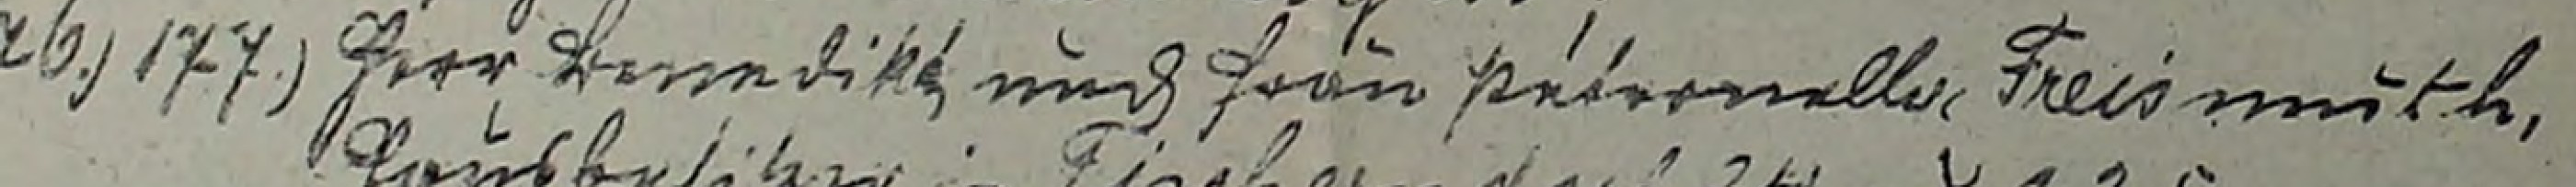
176.) 177.) Herr Benedikt und Frau Petronella Freismuth,
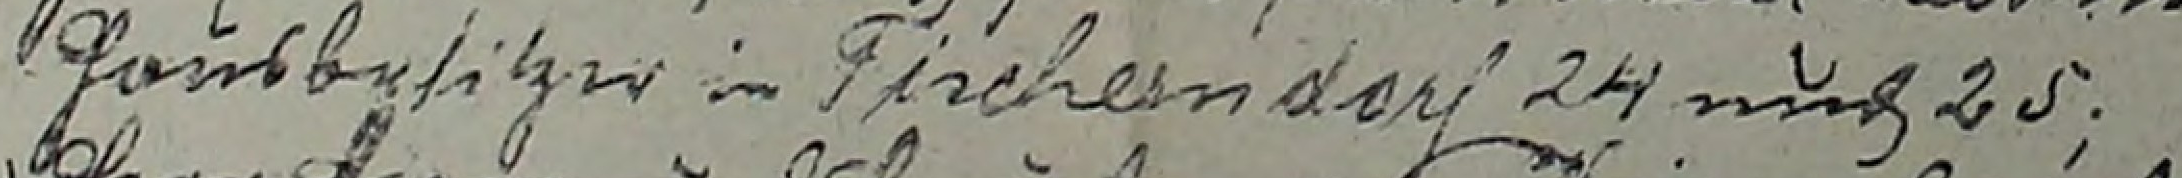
Hausbesitzer in Fischerndorf 24 und 25;
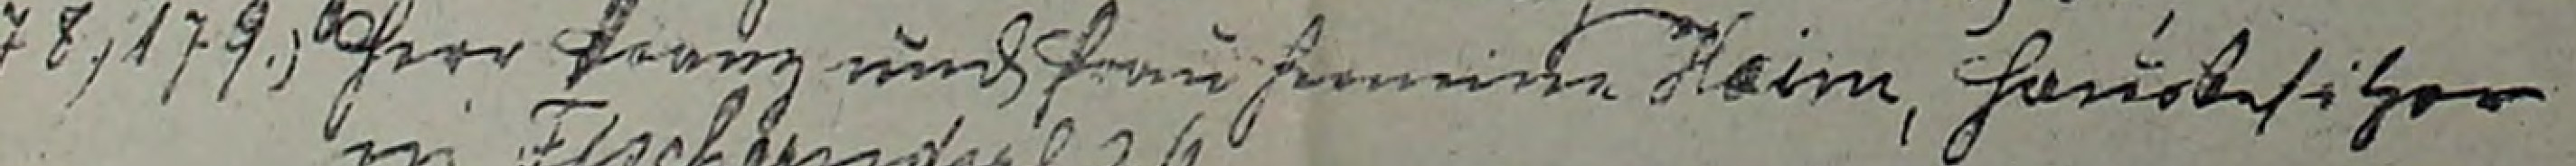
178.) 179.) Herr Franz und Frau Hemeine Haim, Hausbesitzer
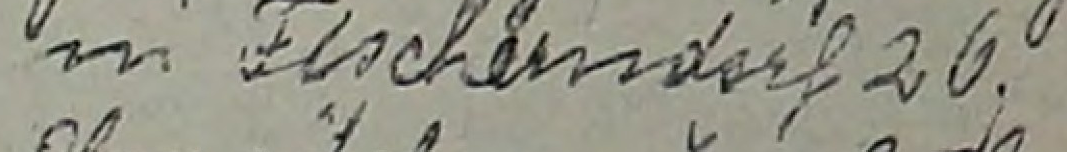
in Fischerndorf 26;
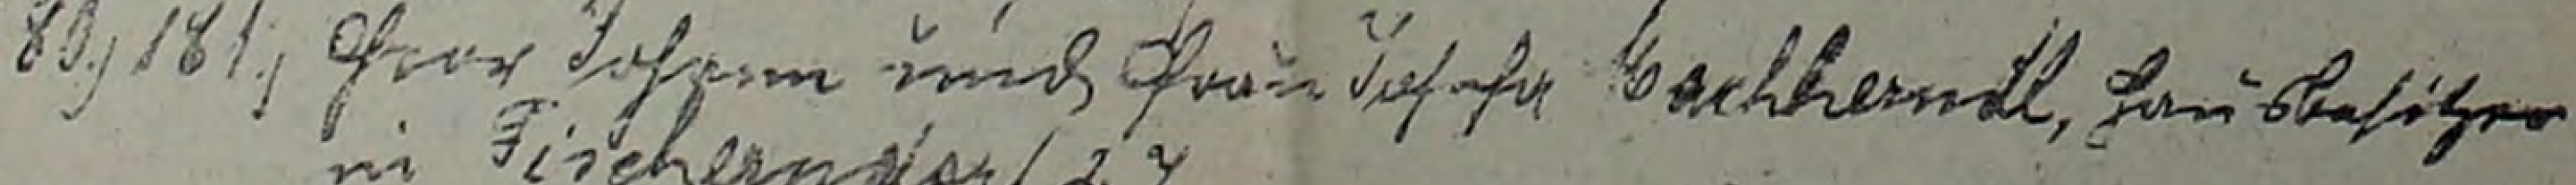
180.) 181.) Herr Johann und Frau Josefa Machherndl, Hausbesitzer
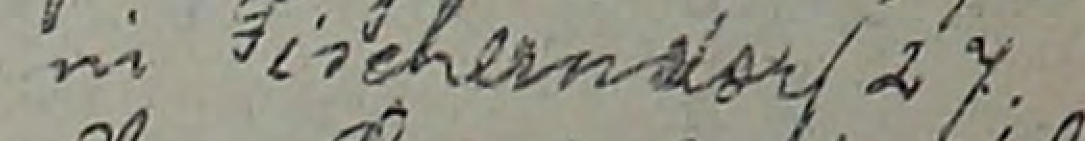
in Fischerndorf 27;
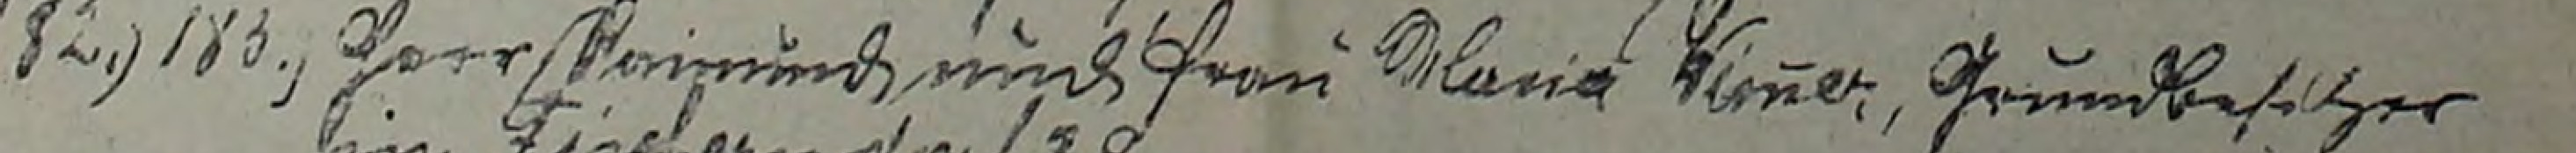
182.) 183.) Herr Raimund und Frau Maria Wimmer, Grundbesitzer
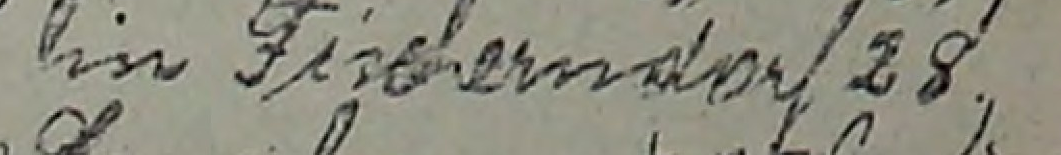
in Fischerndorf 28;
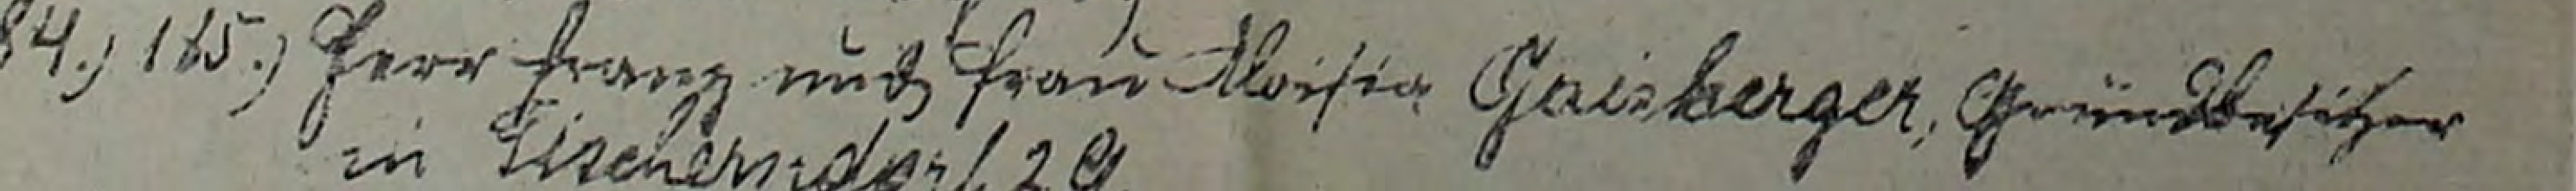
184.) 185.) Herr Franz und Frau Aloisia Gaisberger, Grundbesitzer
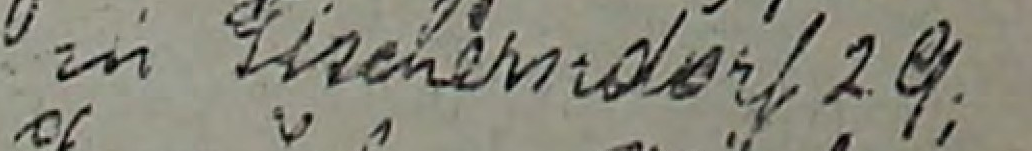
in Fischerndorf 29;
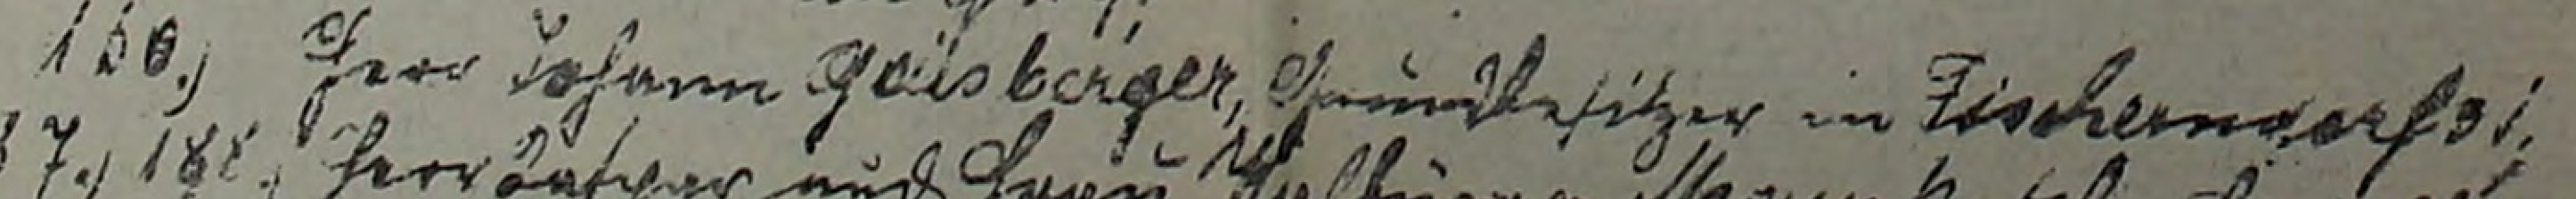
186.) Herr Johann Gaisberger, Grundbesitzer in Fischerndorf 31;
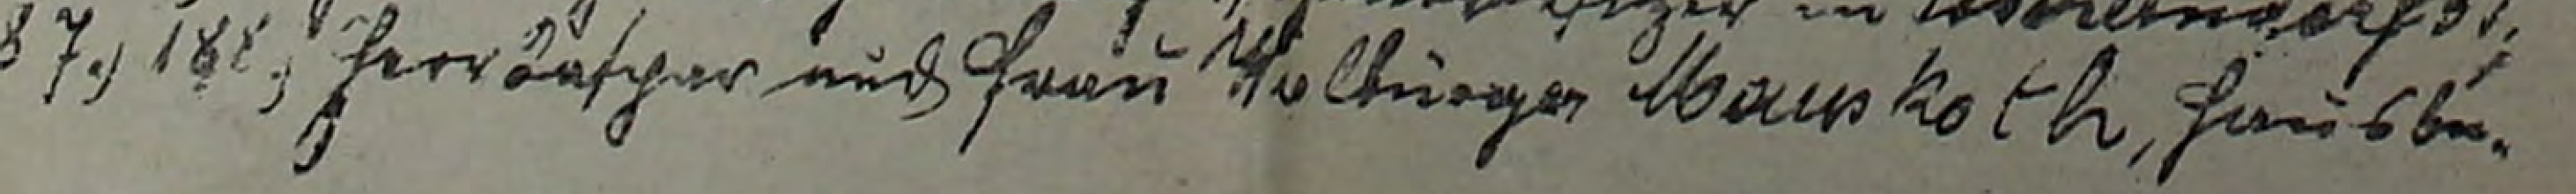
?187.) 188.) Herr Kaspar und Frau Walbürger Mauskoth, Hausbe„
